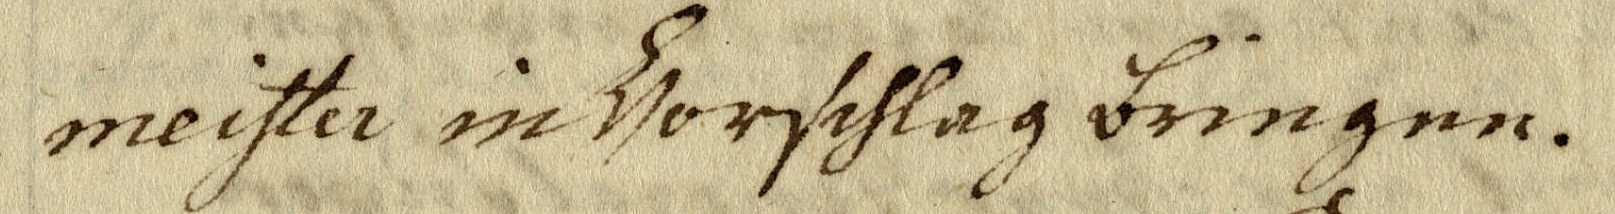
meister in Vorschalg bringen.
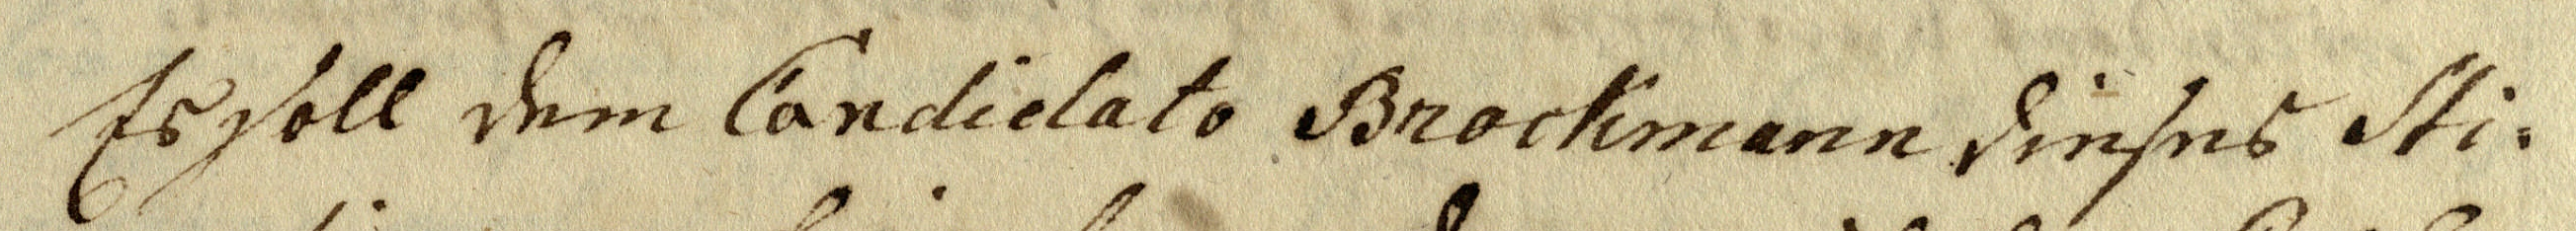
Es soll dem Candidato Brockmann dieses Sti¬
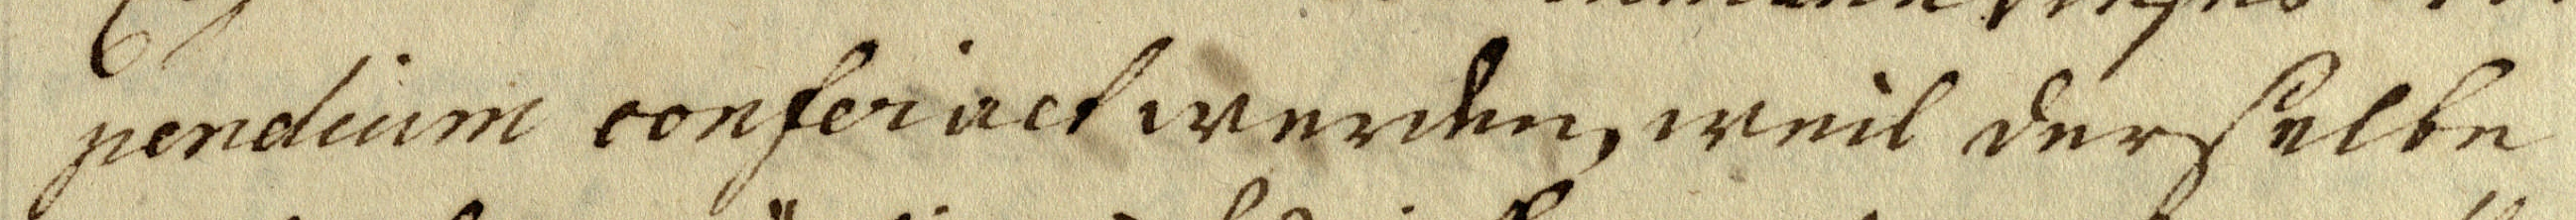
pendium conferiret werden, weil derselbe
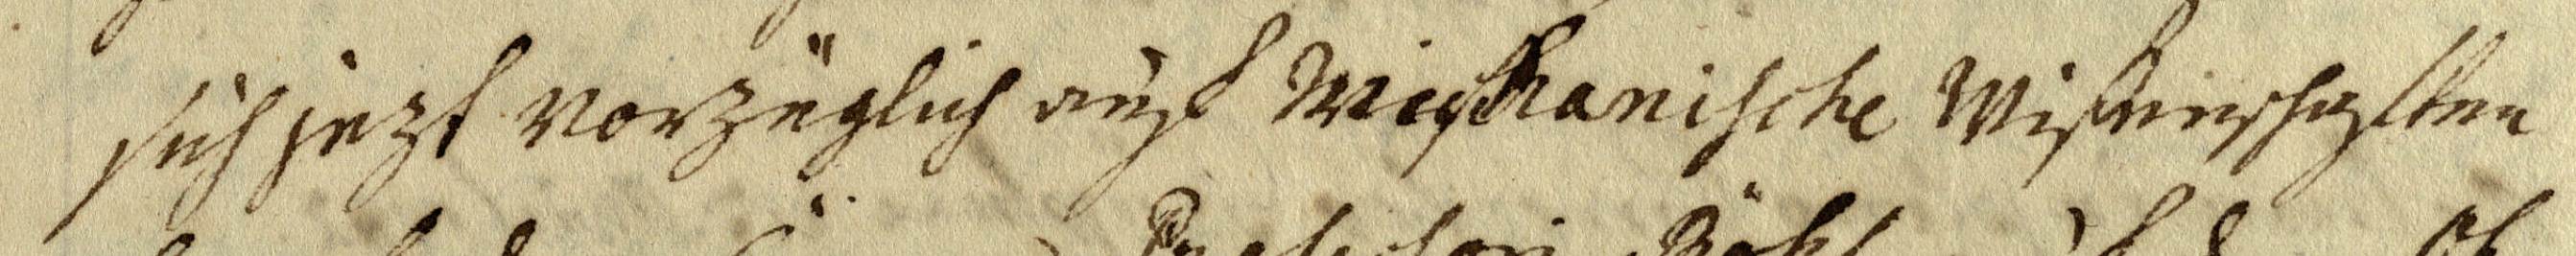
sich jezt vorzüglich auf Mechanische Wissenschaften
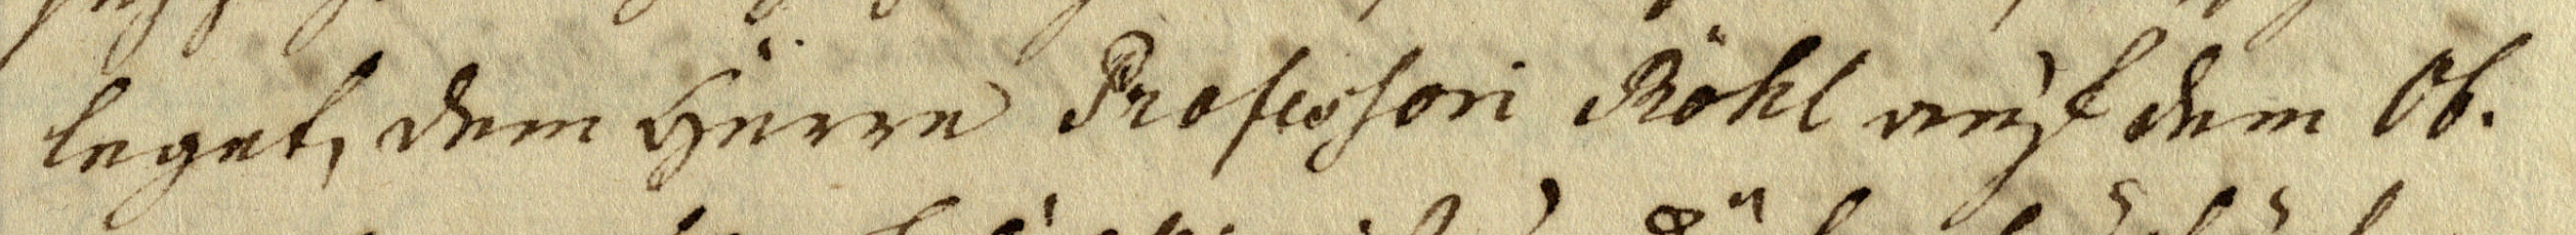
leget, dem Herrn Professori Röhl auf dem Ob¬
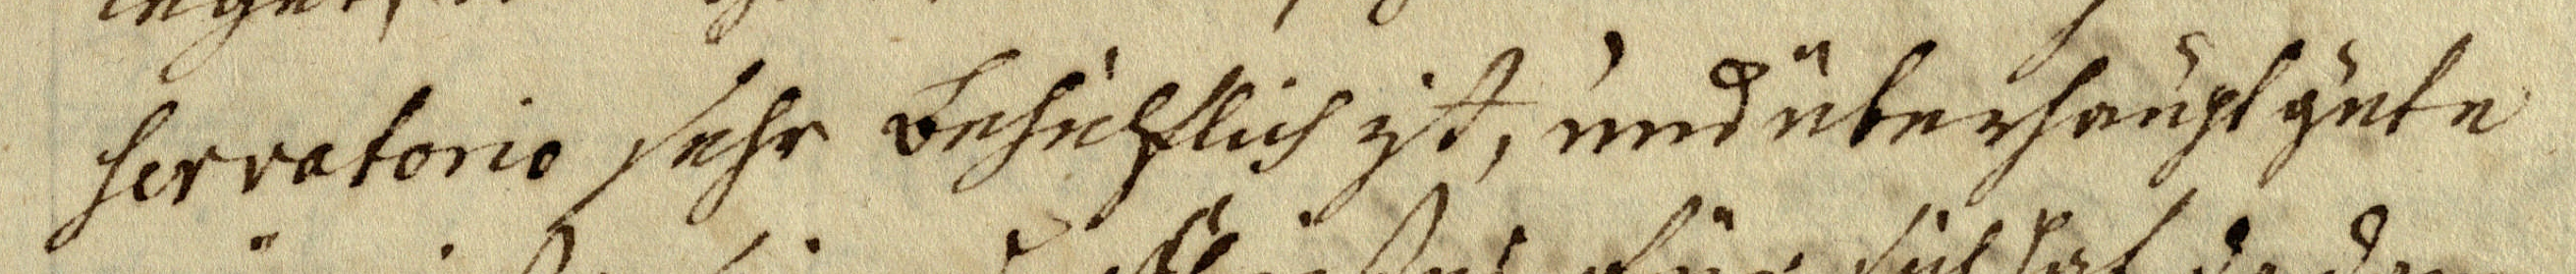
servatorio sehr behülflich ist, und überhaupt gute
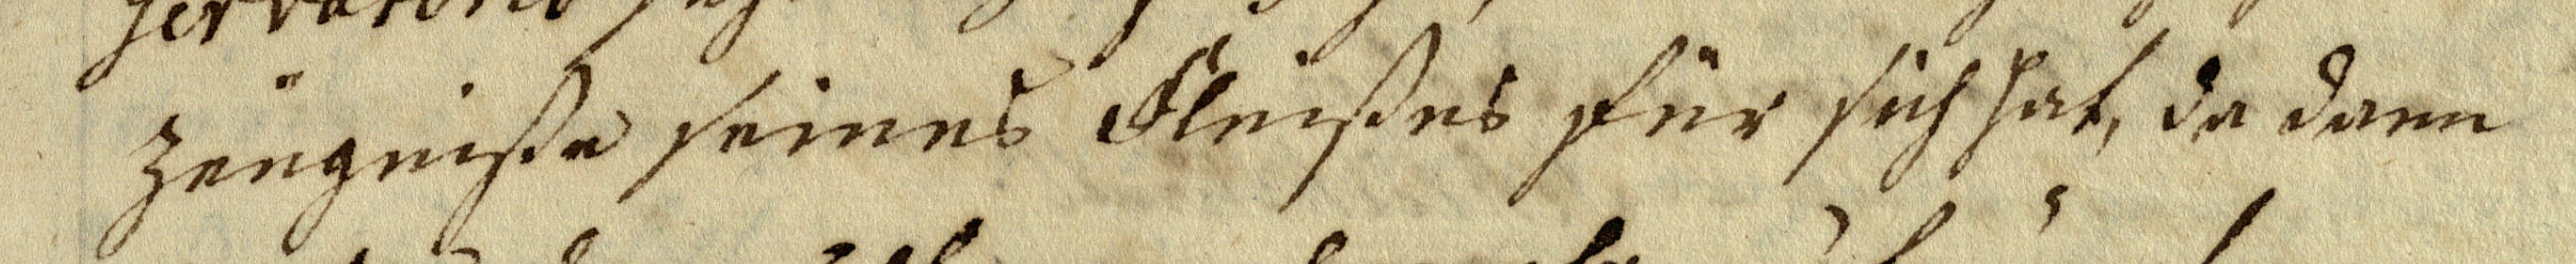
Zeugniße seines Fleißes für sich hat, da dann
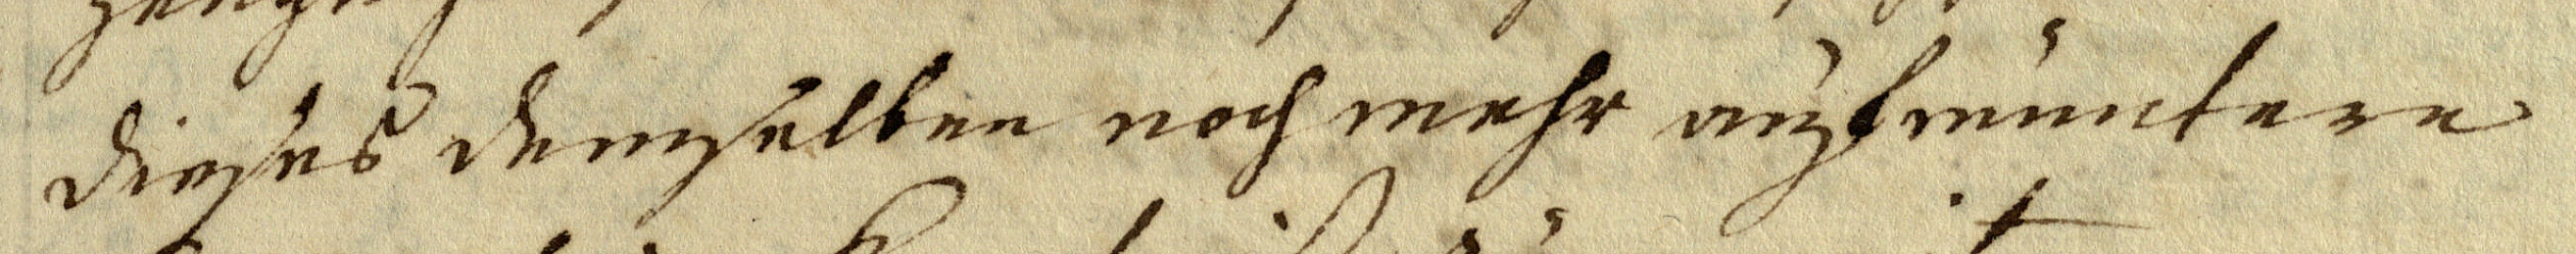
dieses demselben noch mehr aufmuntern
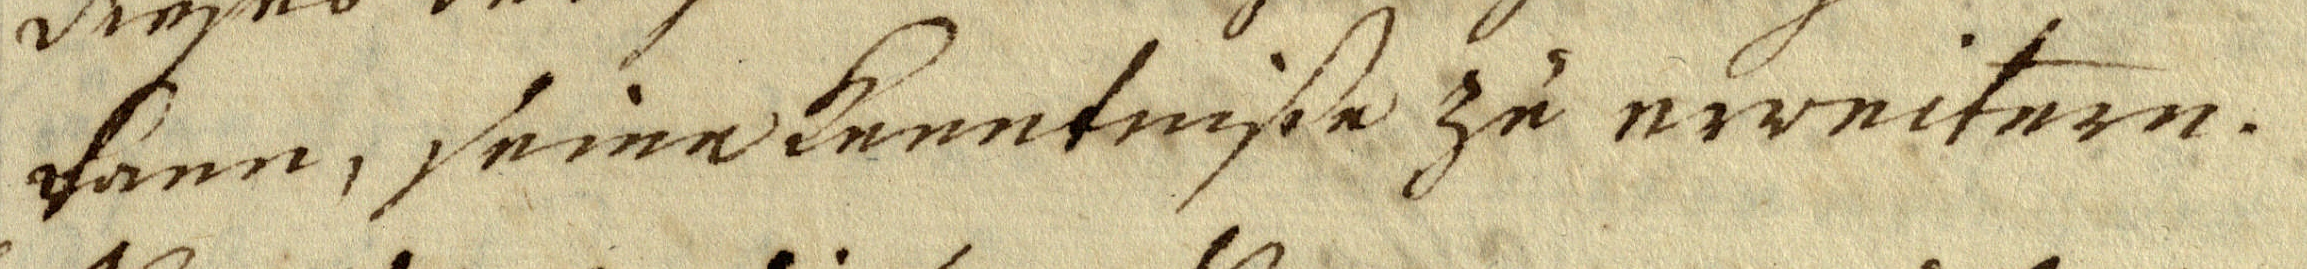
kann, seine Kenntniße zu erweitern.
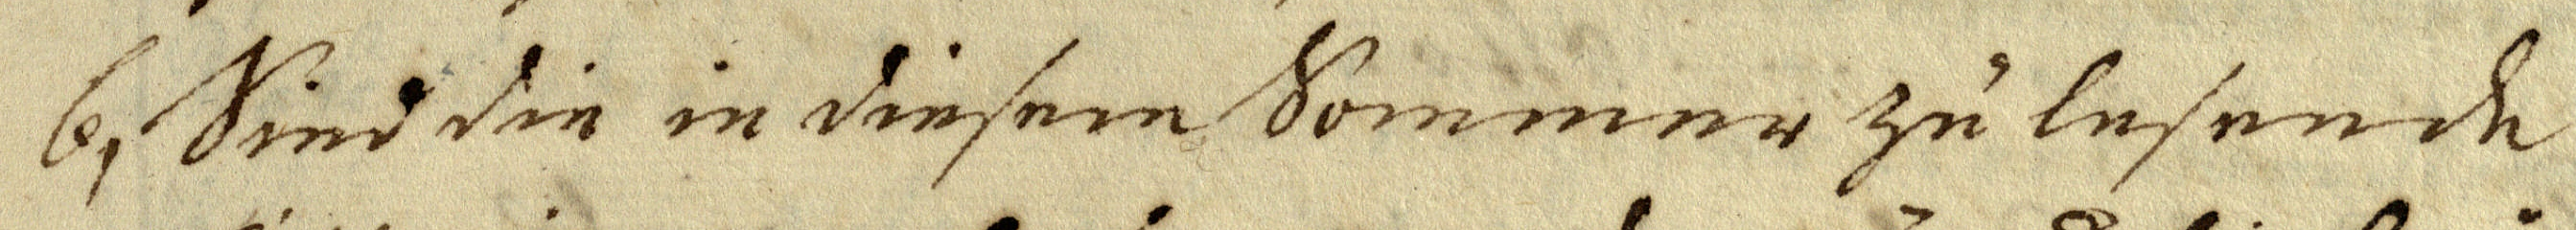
6, Sind die in diesem Sommer zu lesende
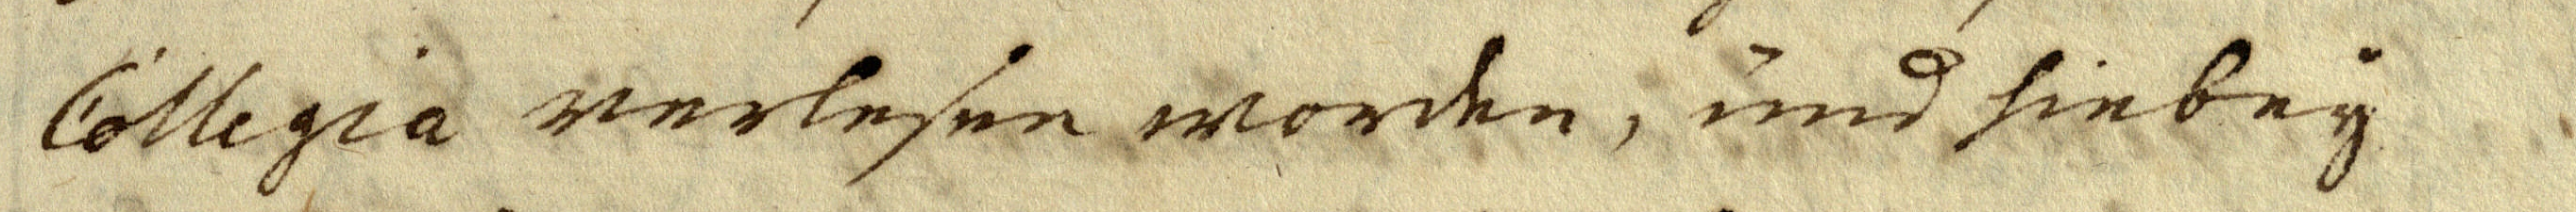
Collegia verlesen worden, und hiebeÿ
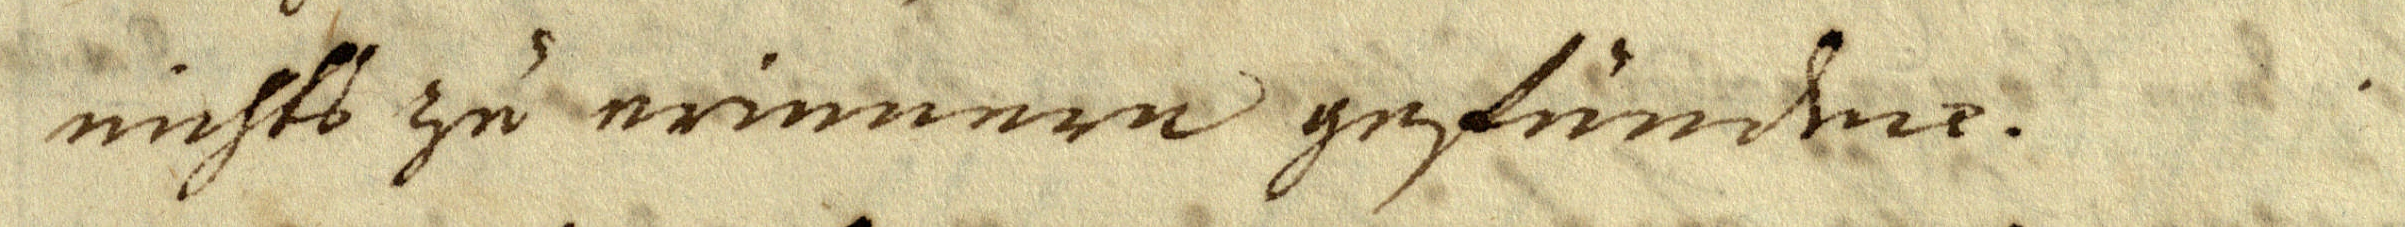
nichts zu erinnern gefunden.
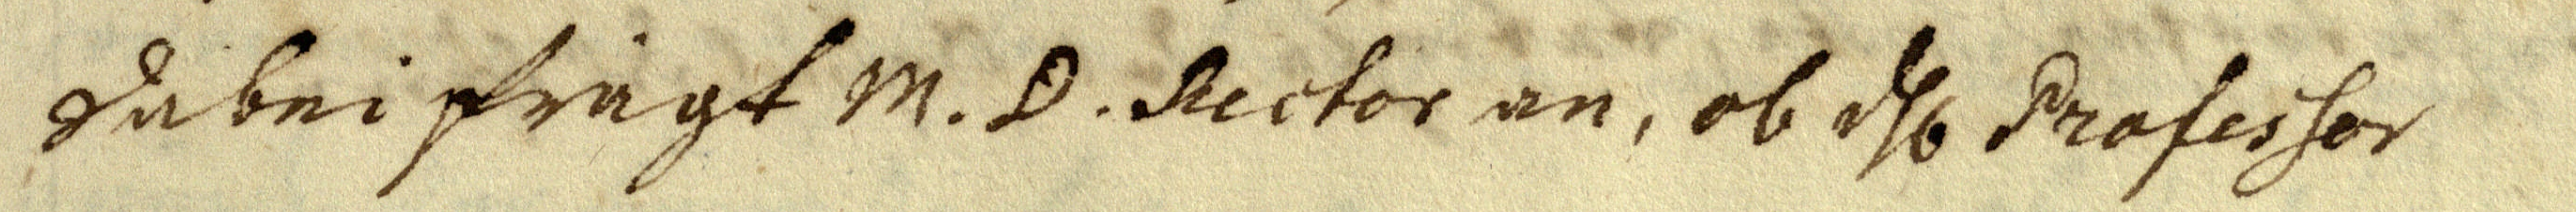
Dabei frägt M. D. Rector an, ob dh Professor
